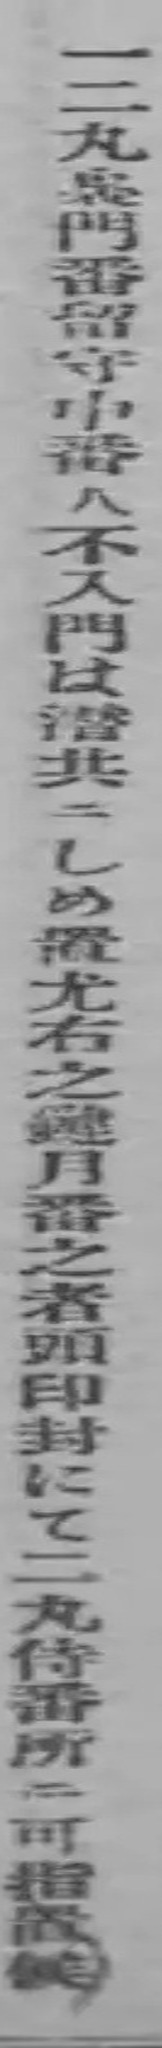一二丸裏門番留守中番人不入門は潜共ニしめ置尤右之鍵月番之者頭印封にて二丸侍番所ニ可指置候
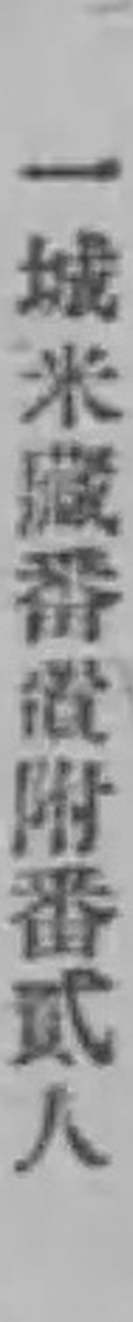一城米蔵番置附番弐人
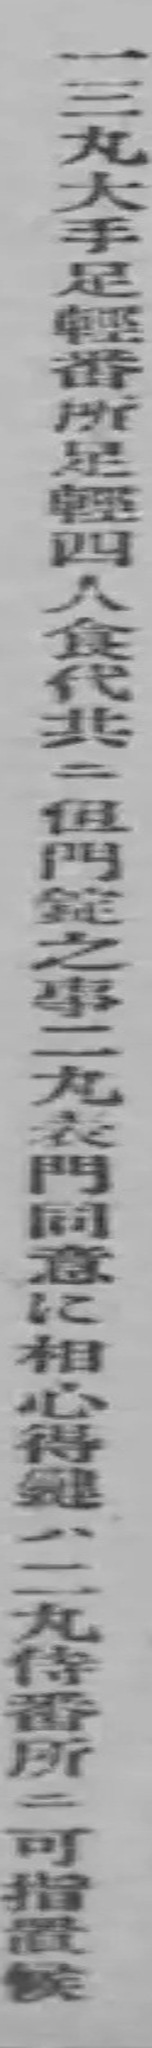一三丸大手足軽番所足軽四人食代共ニ但門錠之事二丸表門同意に相心得鍵は二丸侍番所ニ可指置候
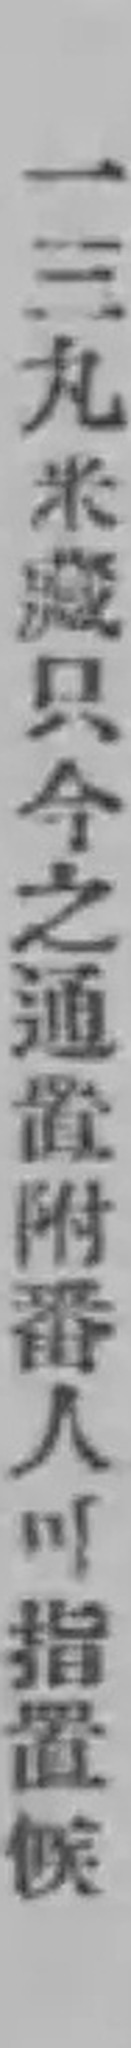一三丸米蔵只今之通置附番人可指置候
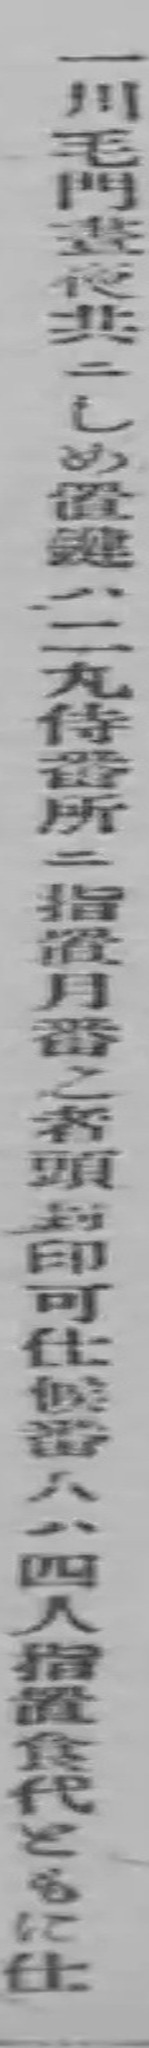一川毛門昼夜共ニしめ置鍵は二丸侍番所ニ指置月番之者頭封印可仕候番人は四人指置食代ともに仕
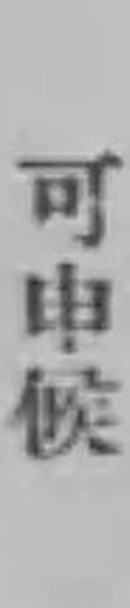可申候
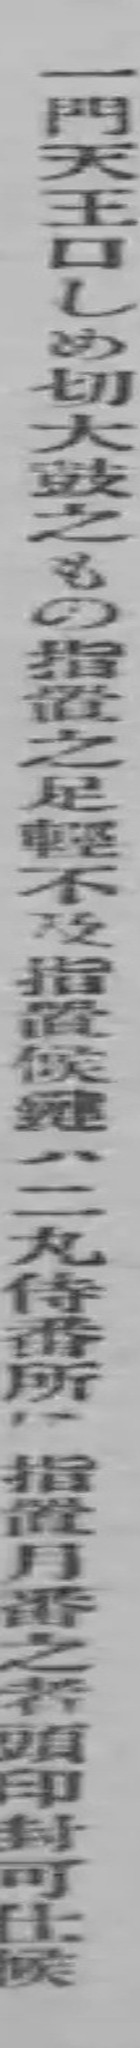一門天王口しめ切大鼓之もの指置之足軽不及指置候鍵は二丸侍番所に指置月番之者頭印封可仕候
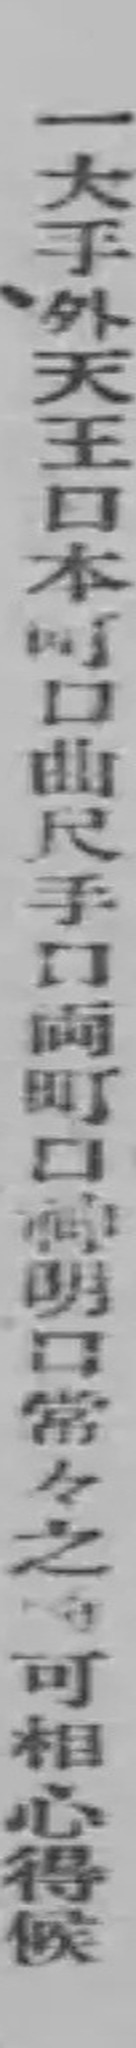一大手外天王口本町口曲尺手口両町口神明口常々之通可相心得候
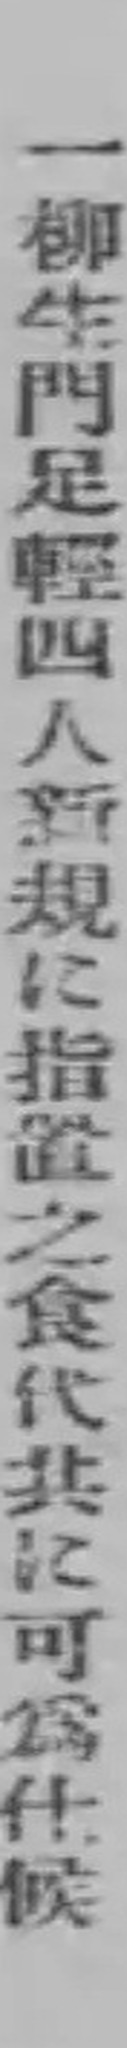一柳生門足軽四人新規に指置之食代共に可為仕候
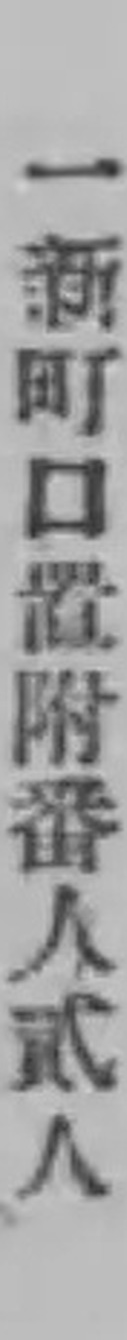一新町口置附番人弐人
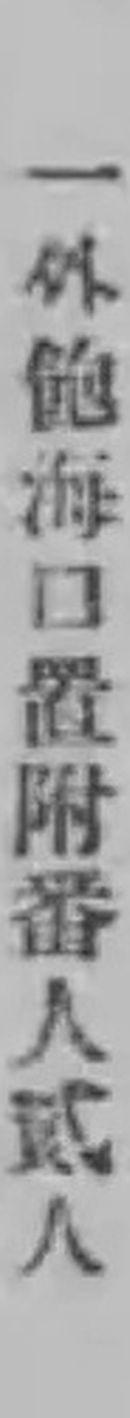一外飽海口置附番人弐人
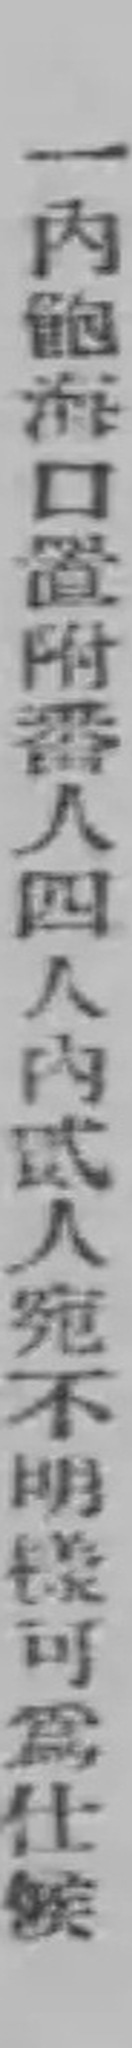一内飽海口置附番人四人内弐人宛不明様可為仕候
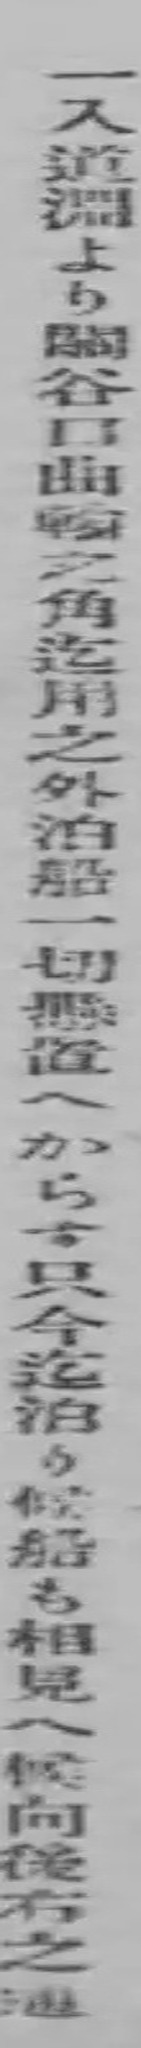一入道淵より関谷口曲輪之角迄用之外泊船一切懸置へからす只今迄泊り候船も相見へ候向後右之通
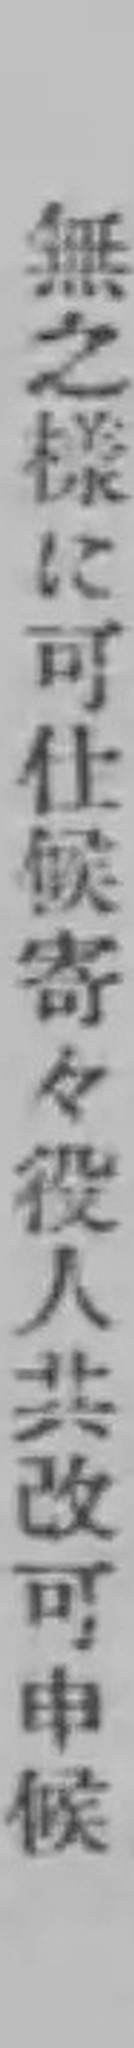無之様に可仕候寄々役人共改可申候
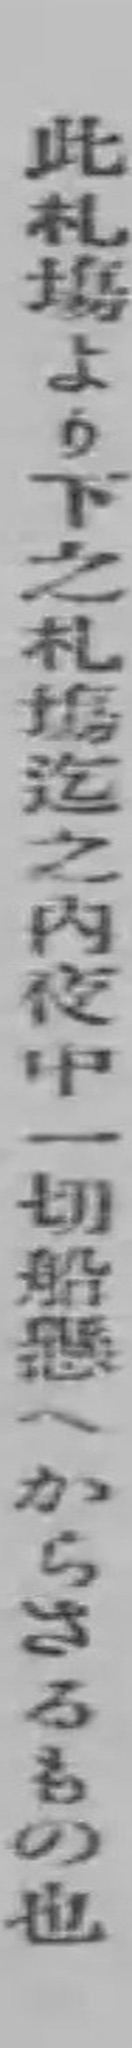此札場より下之札場迄之内夜中一切船懸へからさるもの也
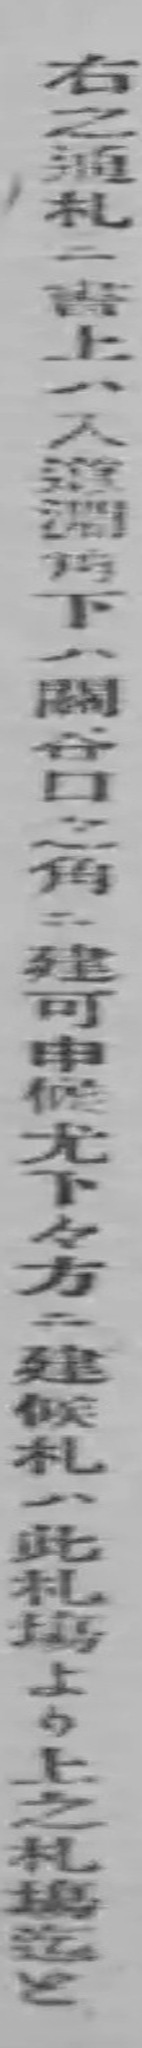右之通札ニ書上は入道淵川下は関谷口之角ニ建可申候尤下々方ニ建候札は此札場より上之札場迄と
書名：豊橋市史談
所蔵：国立国会図書館 National Diet Library, JAPAN
